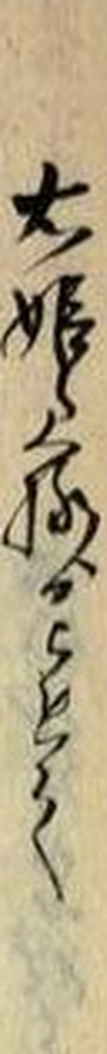右姫君様ゟ被進之
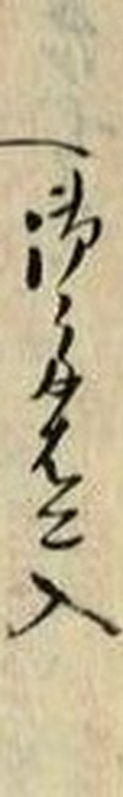御たはこ入
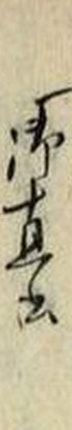御直書
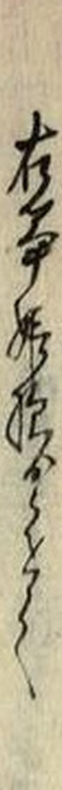右箏姫様ゟ被進之
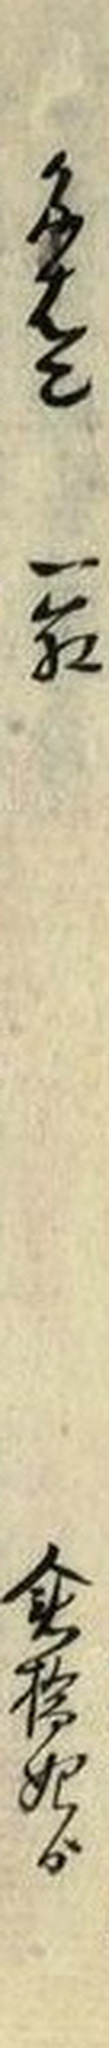たはこ一箱倉橋始ゟ
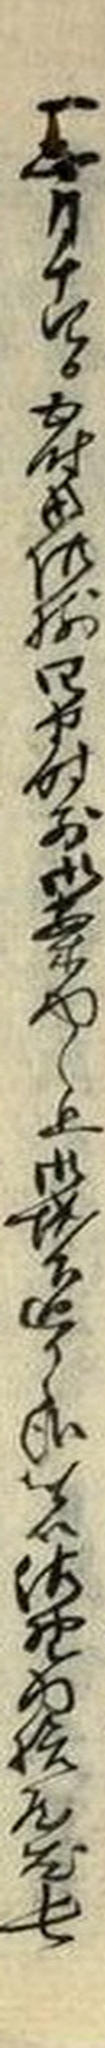一正月十四日五時御供揃四半時前御案内之上御城下廻り之趣を以佐野内膳屋敷長
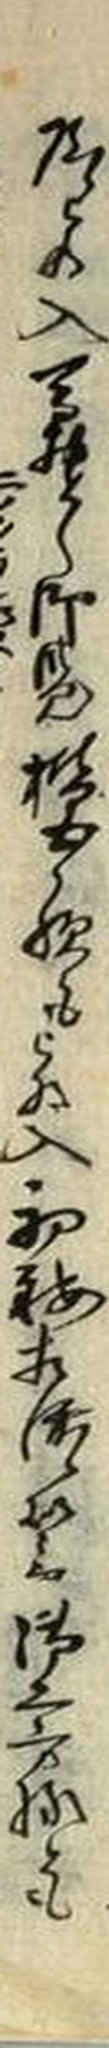屋へ被為入馬おとし御覧揩五郎様ニも被為入初鞍相済候処ニ而御二方様とも
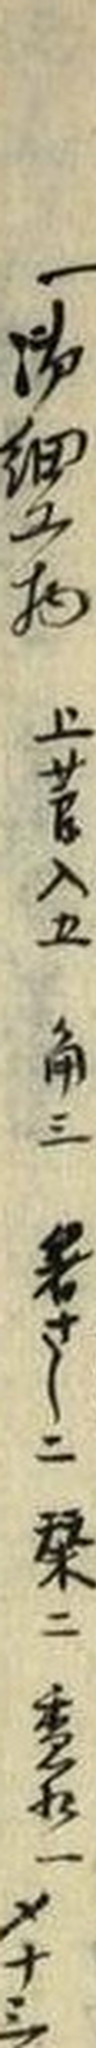御細工物上莨入五角三箸さし二栞二香箱一
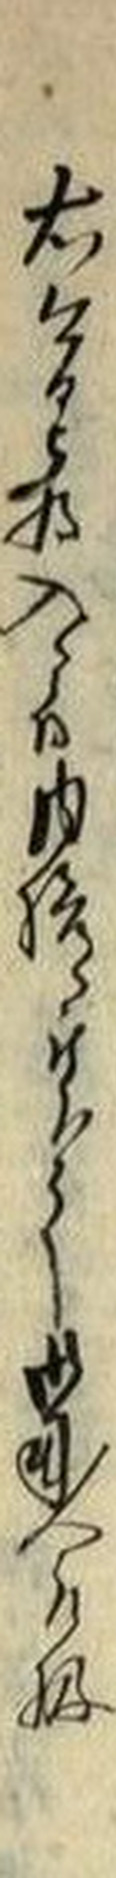右今日被為入候ニ付内膳へ被下之御用人取扱
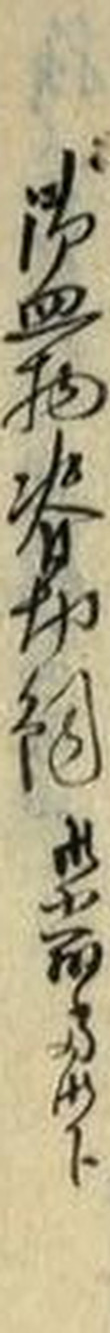御皿物背切鯛御小弁当御下

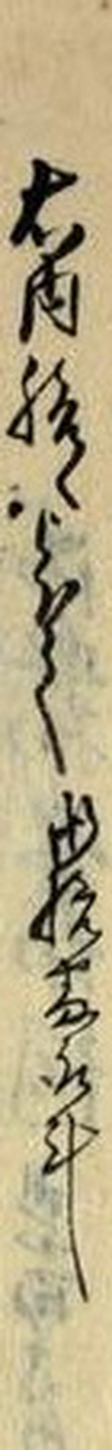右内膳へ被下之御膳番取斗
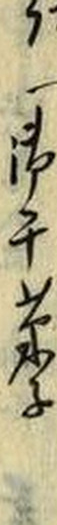御干菓子
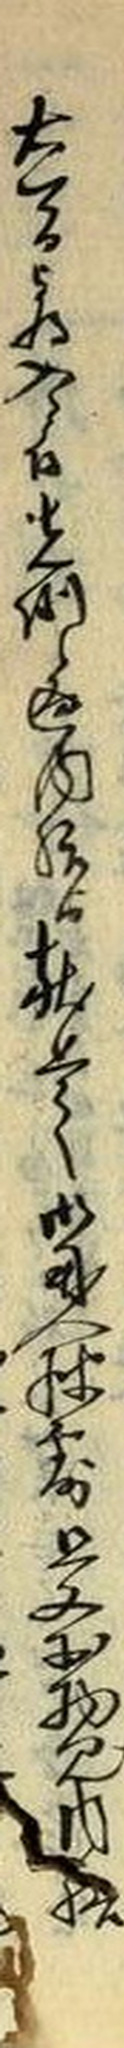右今日被為入候付先例之通内膳ゟ献上之御用人披露且又於物見内膳
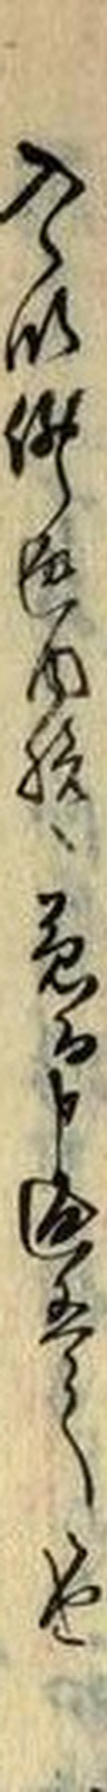入候段例之通内膳へ兼而申通有之候由
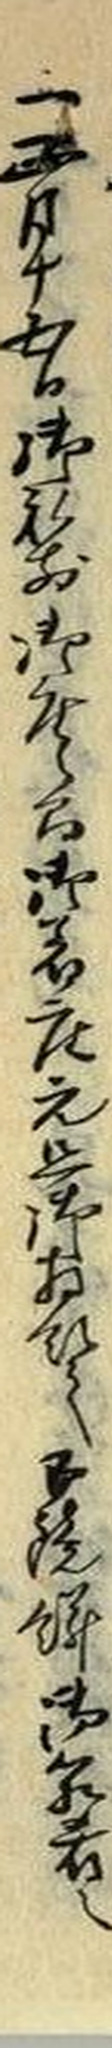一正月十五日御礼前御座之間御着座元旦御拝領之御鏡餅御箱肴之
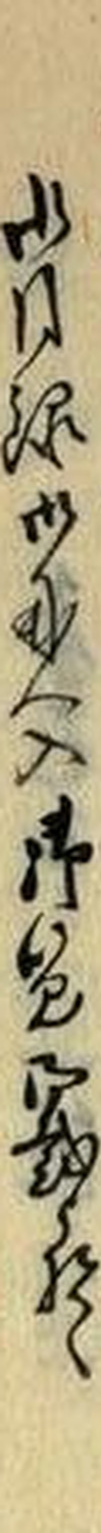御目録御用人入御覧御戴被遊候
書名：少傅日録抄（斉承付側向頭取日記、在国）
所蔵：福井県文書館 Fukui Prefectural Archives
